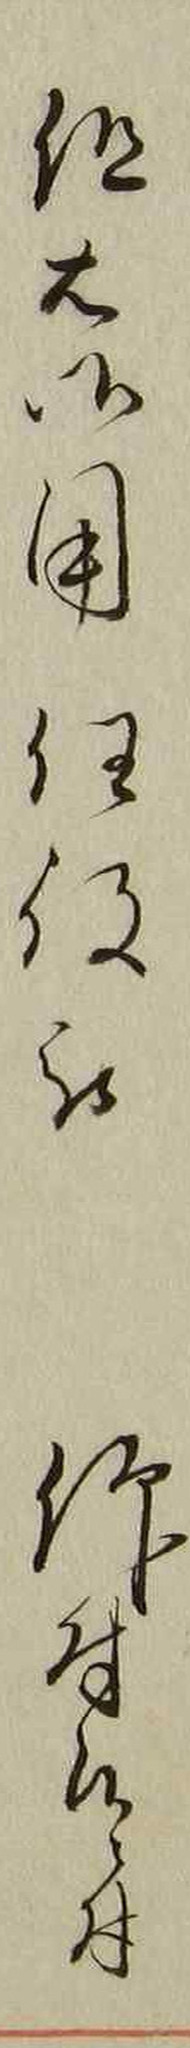但右御用任役被仰付候ニ付
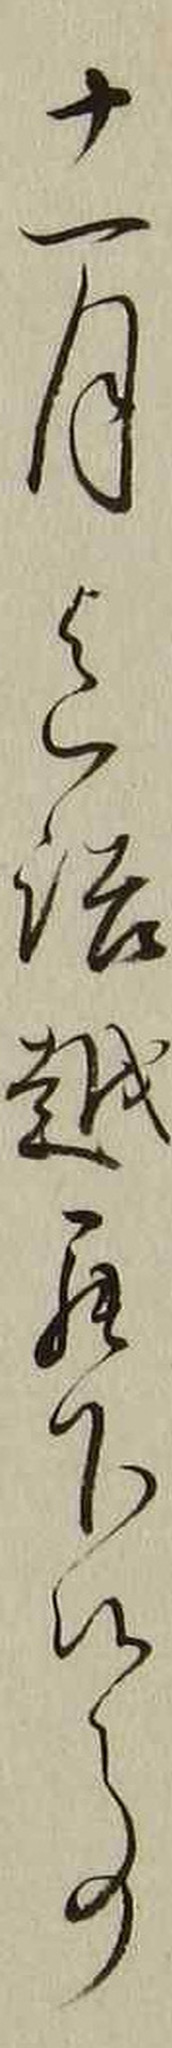十一月迄詰越罷下候事
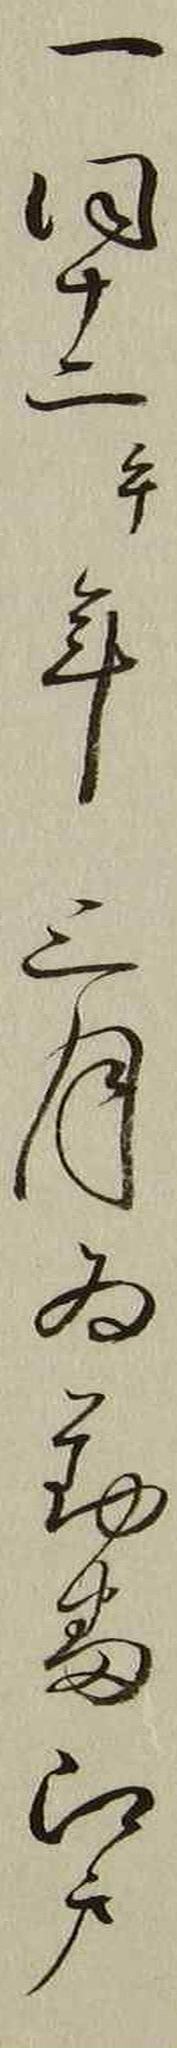一同十二午年三月為勤番江戸
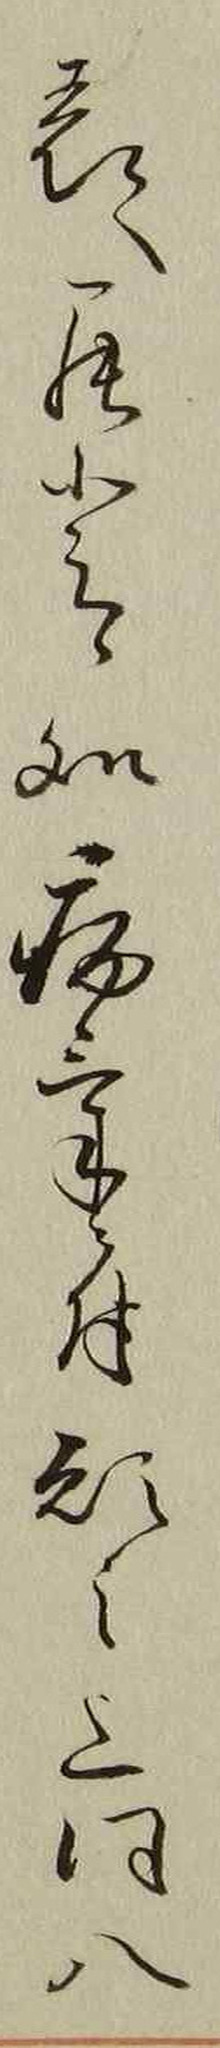表へ罷登候処病気ニ付願之上同八
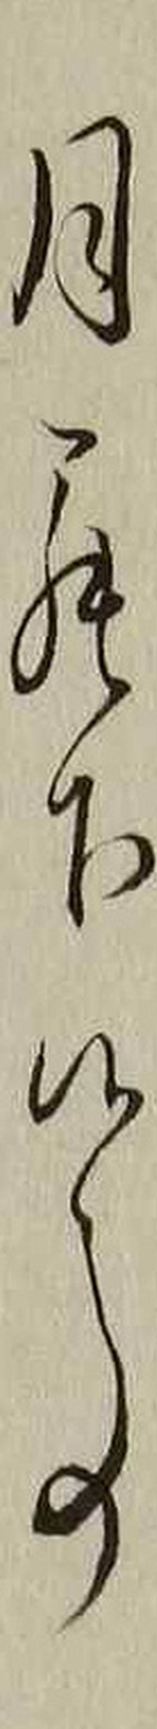月罷下候事
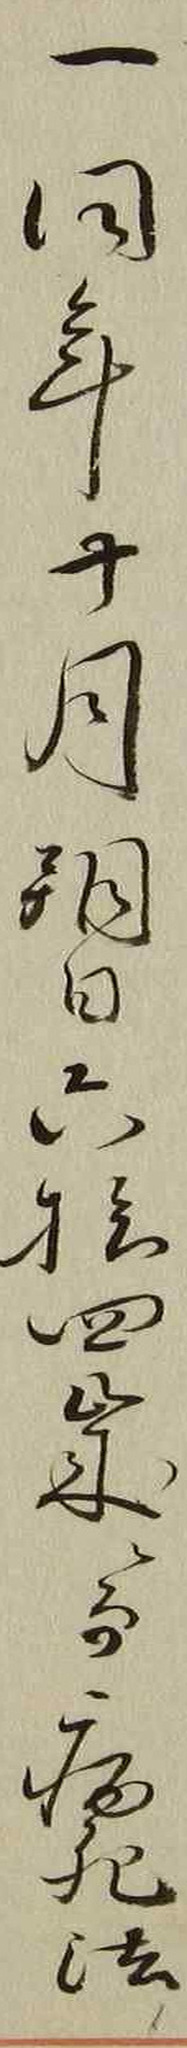一同年十月朔日六拾四歳ニ而病死法
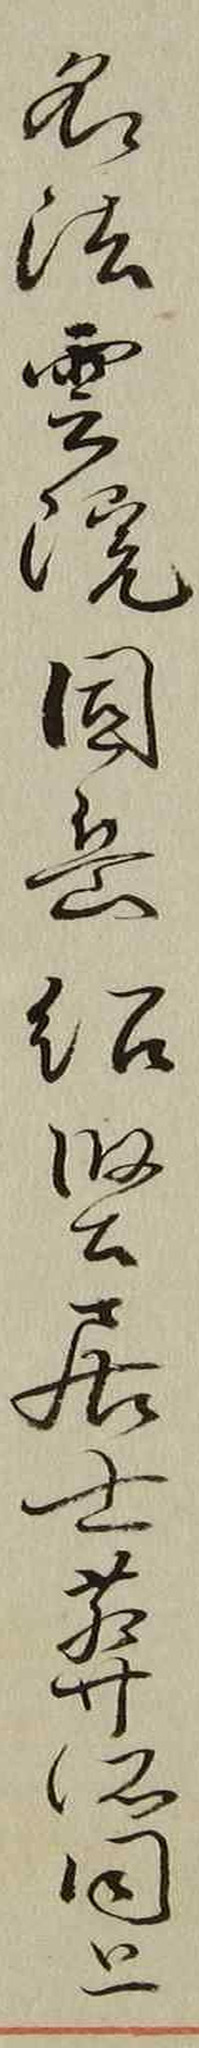名法雲院固岳紹堅居士葬所同上
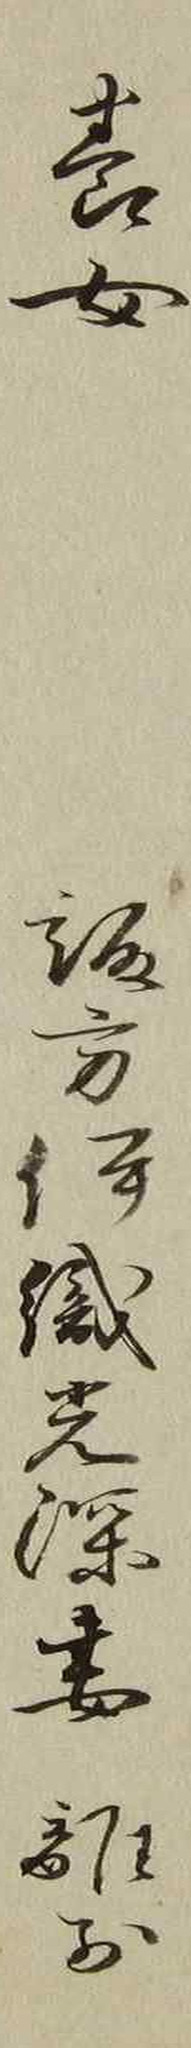養女諏方伊織光深妻離別
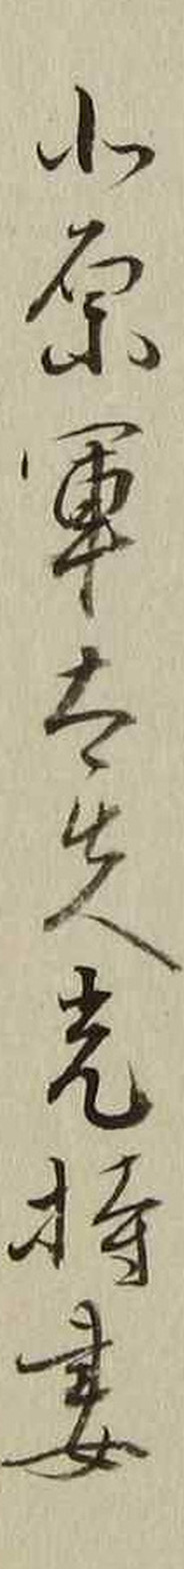北原軍太夫光持妻
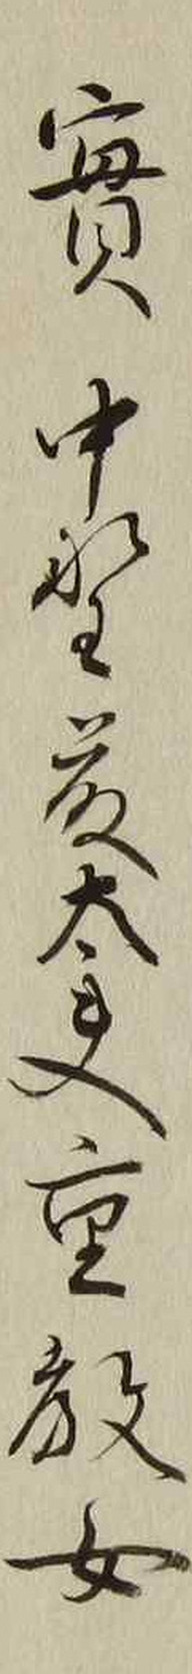実中野藤太夫重教女
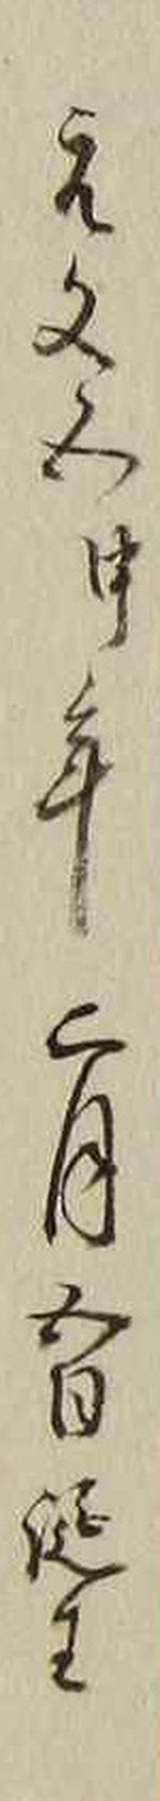元文五申年二月五日誕生
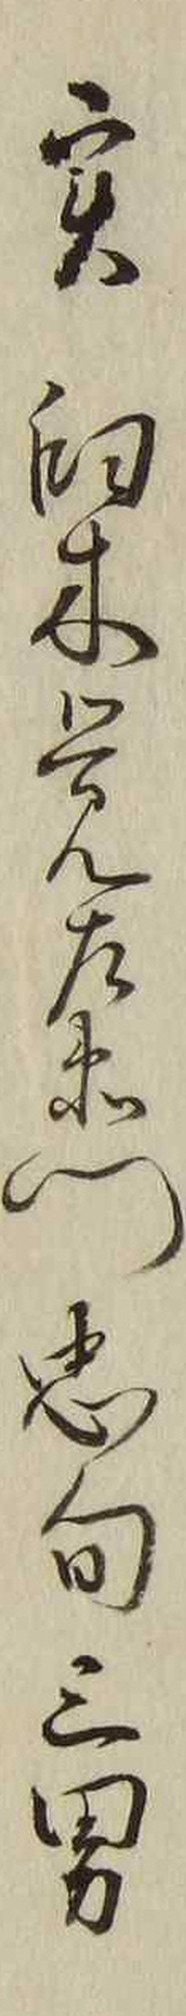実臼木覚左衛門忠旬三男

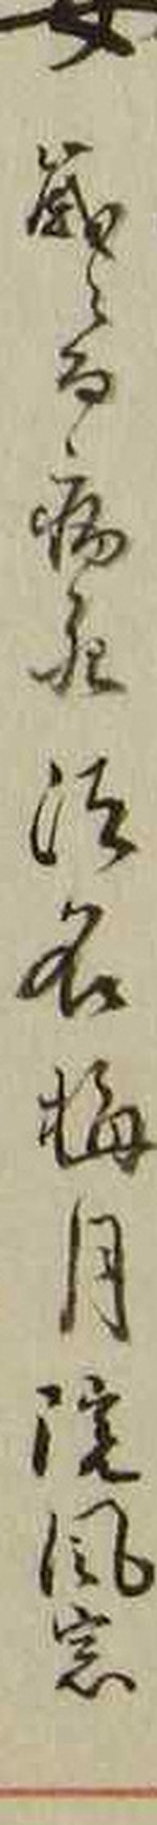歳ニ而病死法名梅月院風窓
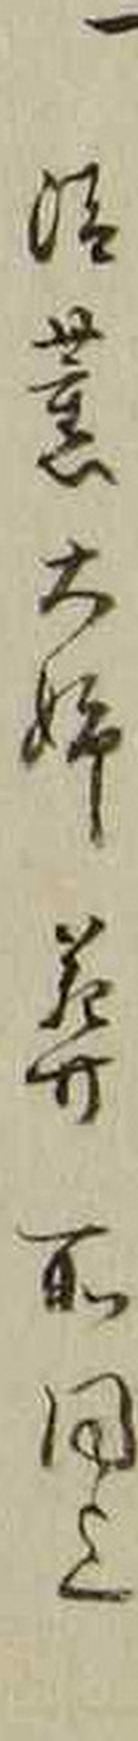清薫大姉葬所同上
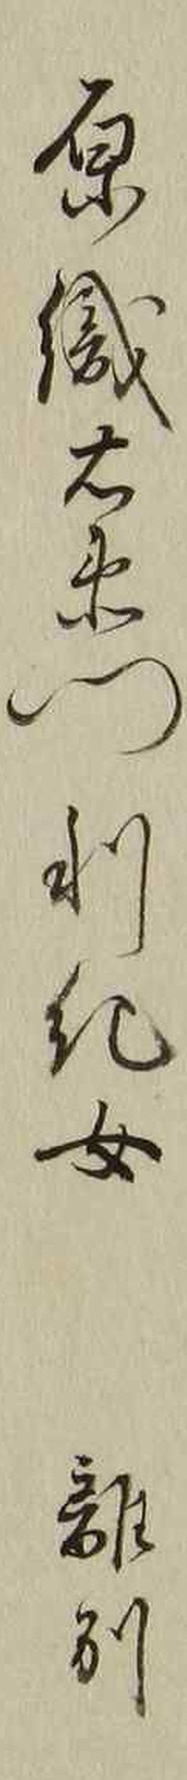原織右衛門利期紀女離別
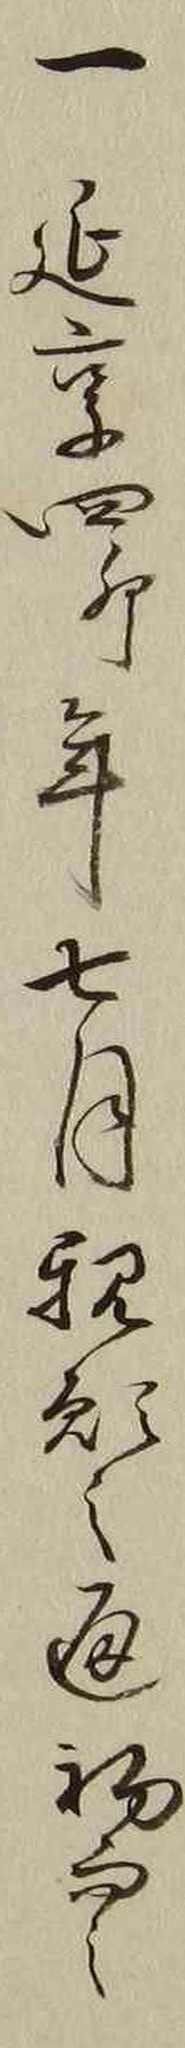一延享四卯年七月親願之通初而之
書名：諸士系譜　巻之2　い之部2
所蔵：会津若松市立会津図書館
